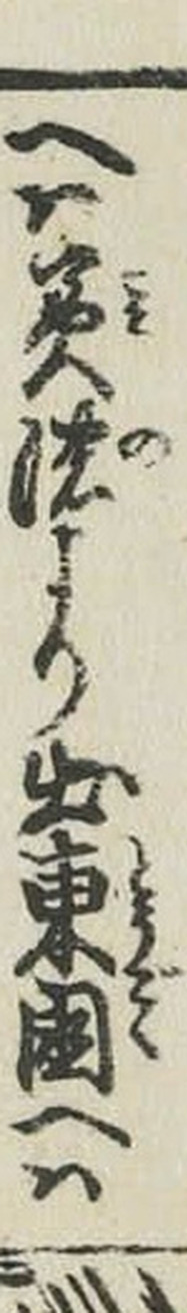へは美濃より出東国へは
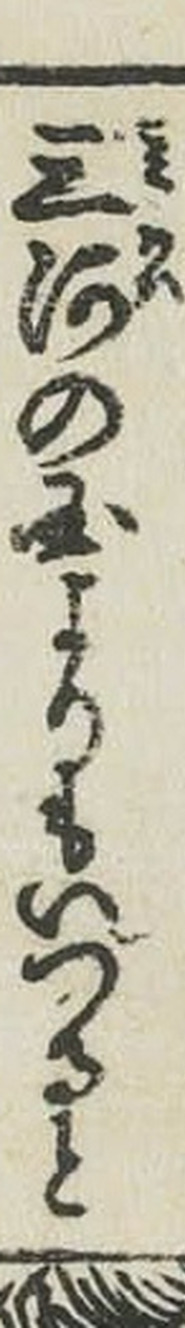三河の国よりもいづると
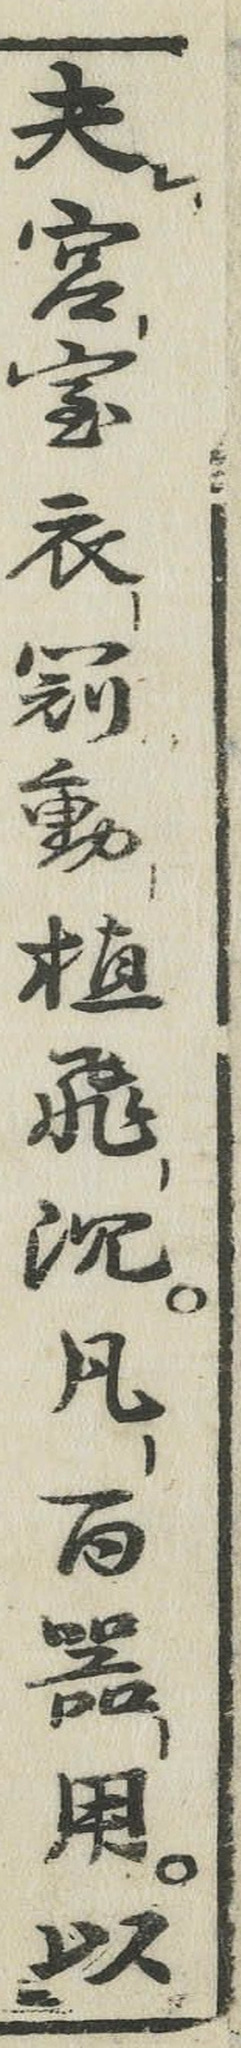夫宮-室衣-冠動-植飛-沈。凡-百器-用。以
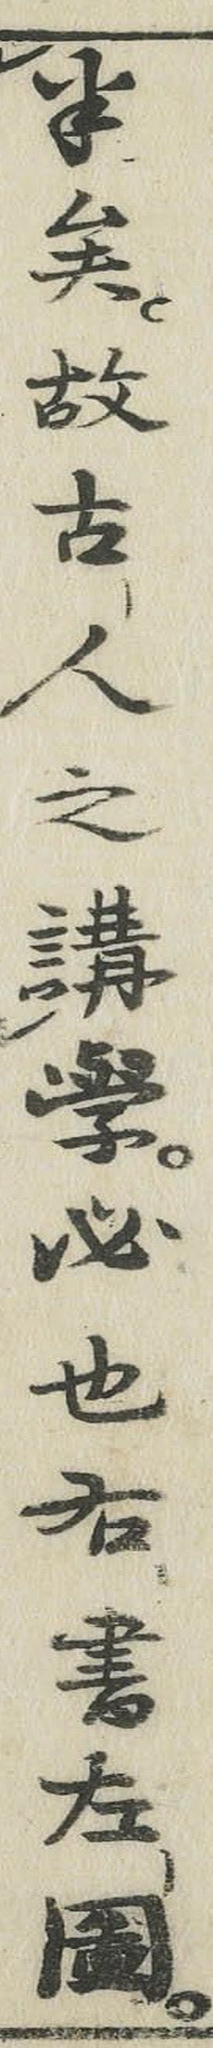半矣。故古-人之講学。必也右-書左-図。
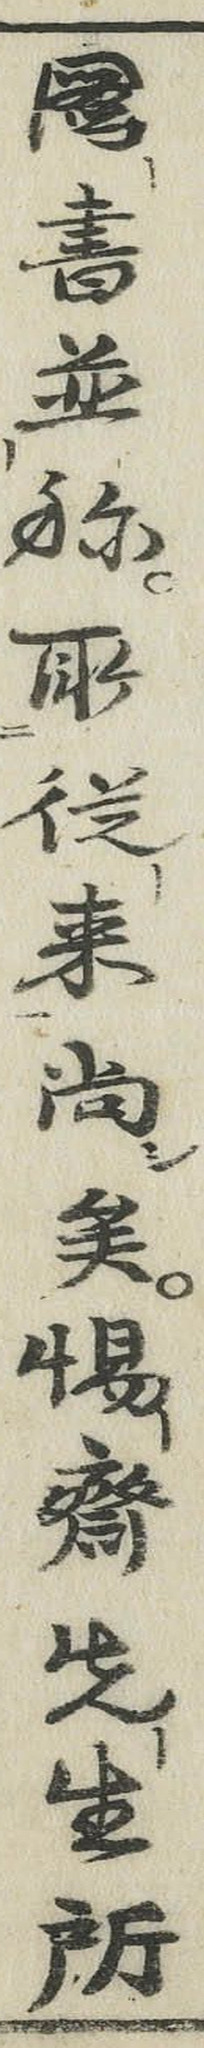図-書並-称。取従-来尚矣。惕-齋先-生所
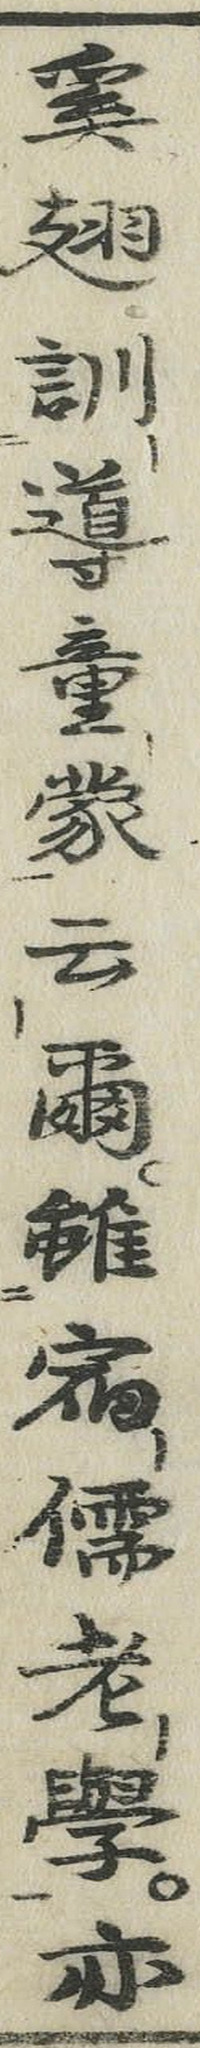奚翅。訓-導童-蒙云-爾。雖宿-儒老-学。亦

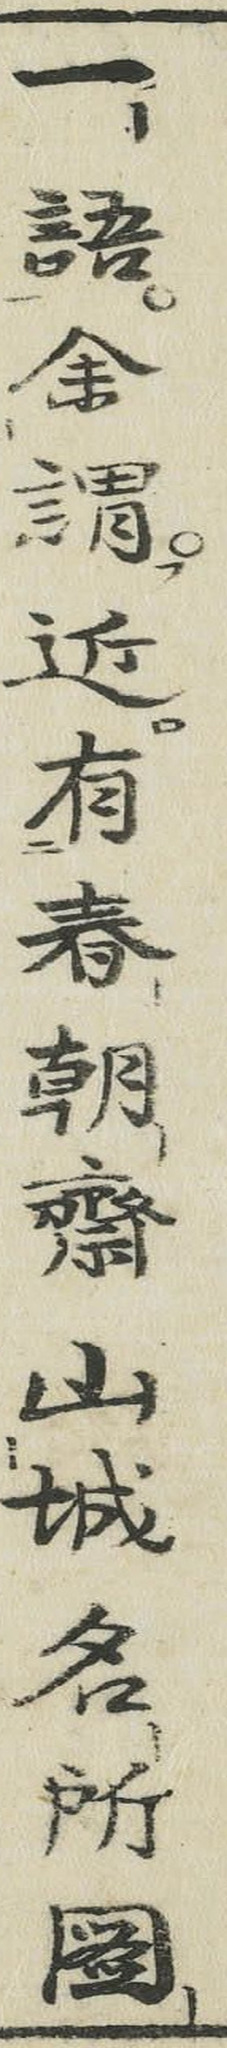一-語。余-謂。近。有春-朝-齋山-城名-所図-
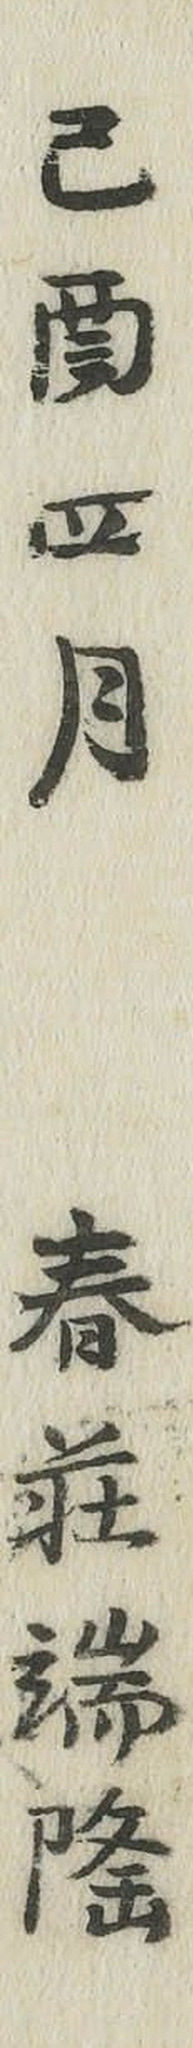己酉四月春荘端隆

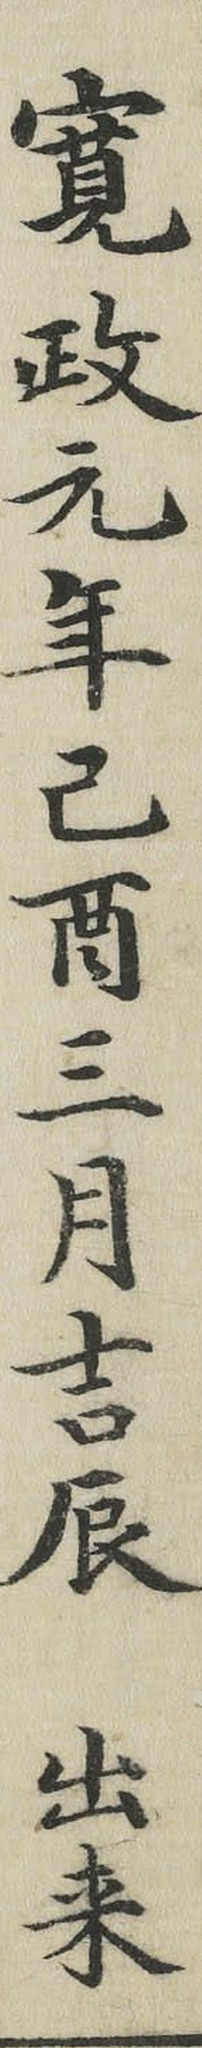寛政元年己酉三月吉辰出来
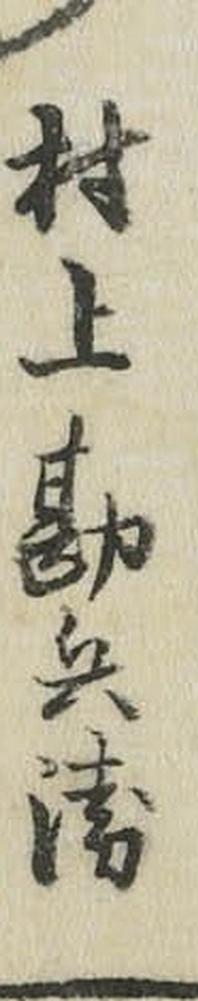村上勘兵衛
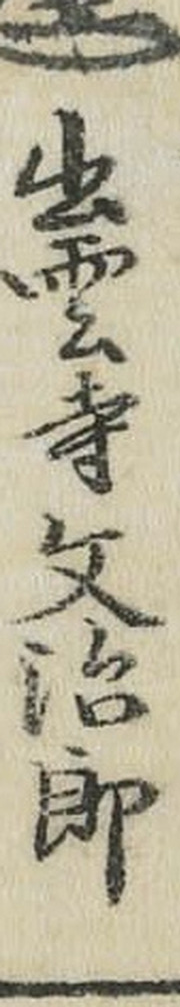出雲寺文治郎
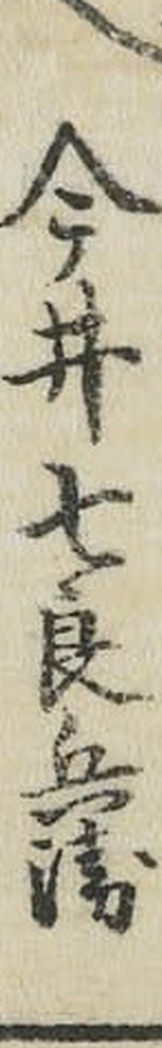今井七良兵衛
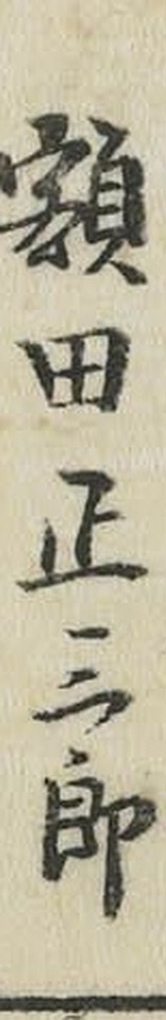額田正三郎
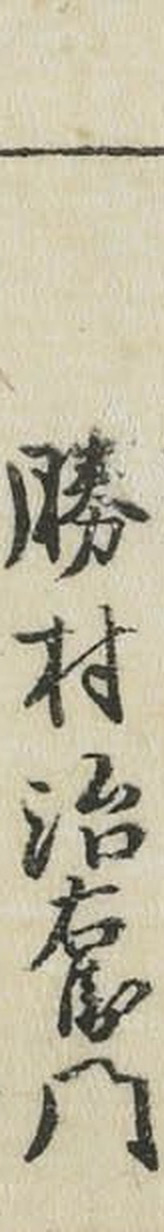勝村治右衛門
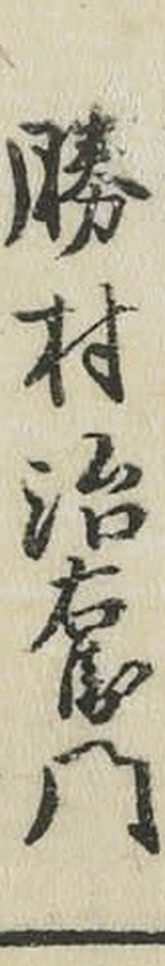勝村治右衛門
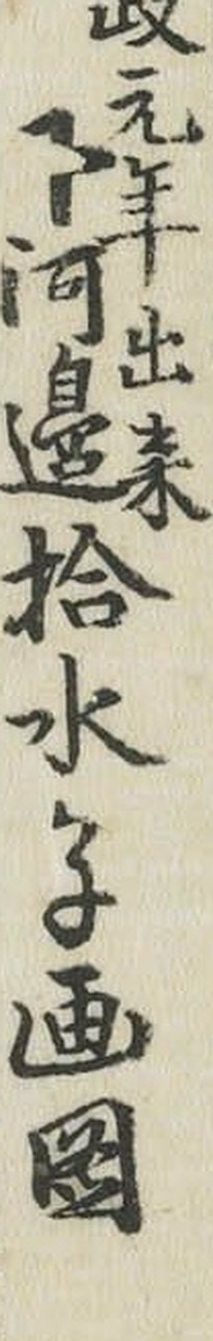下河邉拾水子画図
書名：増補頭書訓蒙図彙大成 10巻 10:巻之21
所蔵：東京学芸大学教育コンテンツアーカイブ
